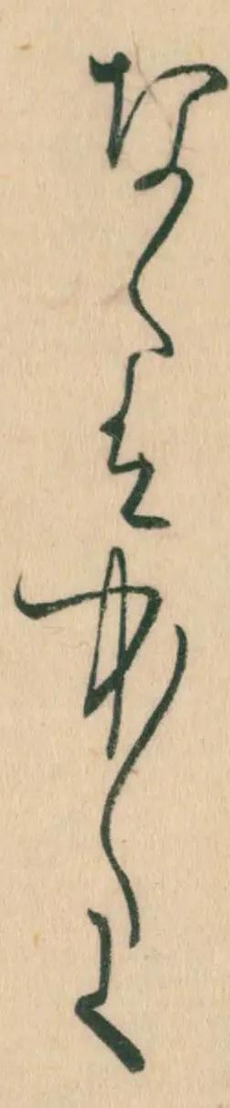なくは中〳〵に人
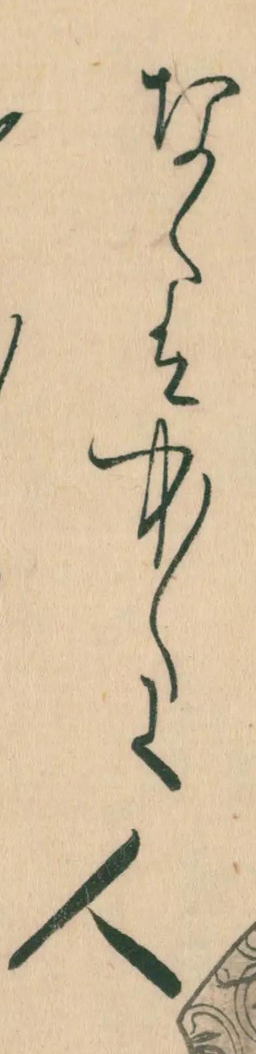なくは中〳〵に人
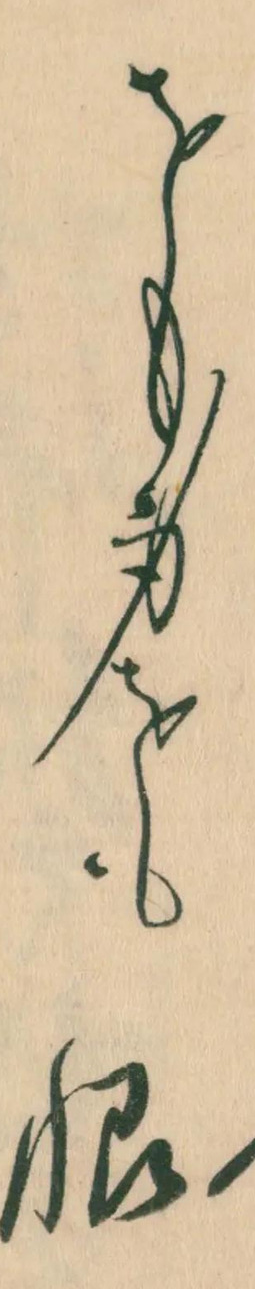をも身をも恨
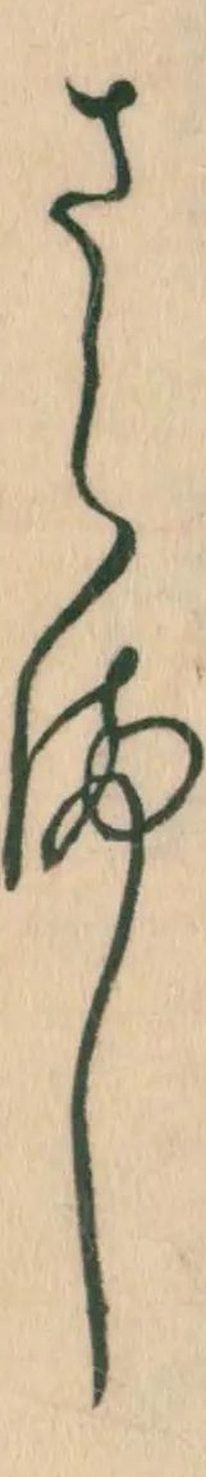さらまし
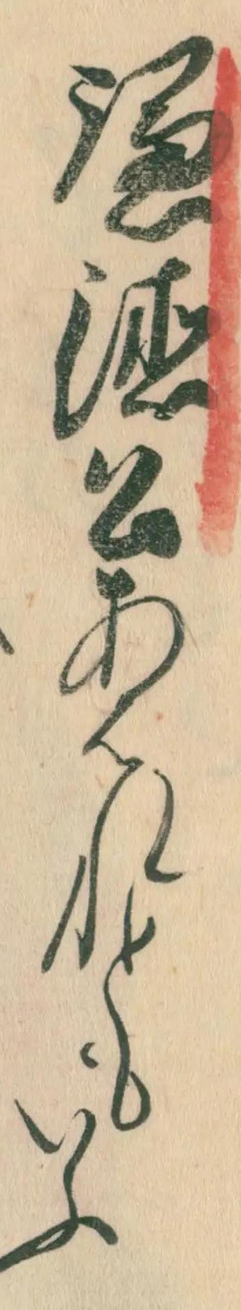謙徳公あはれともいふ
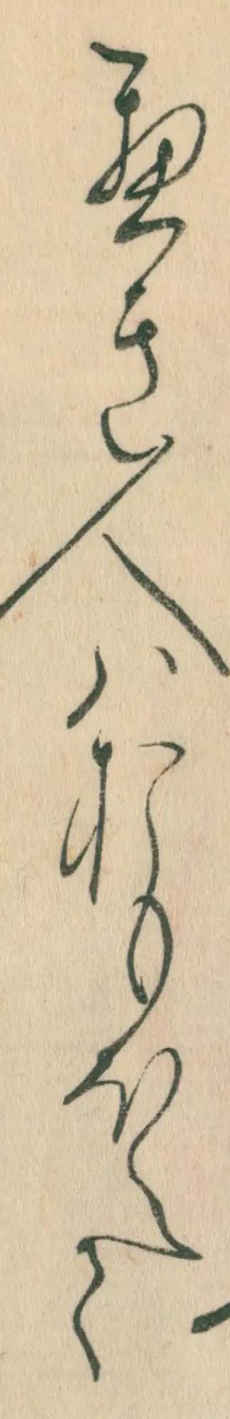へき人はおもほえて
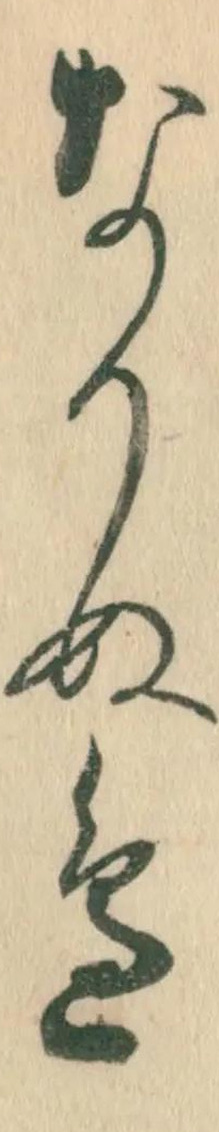なりぬへ
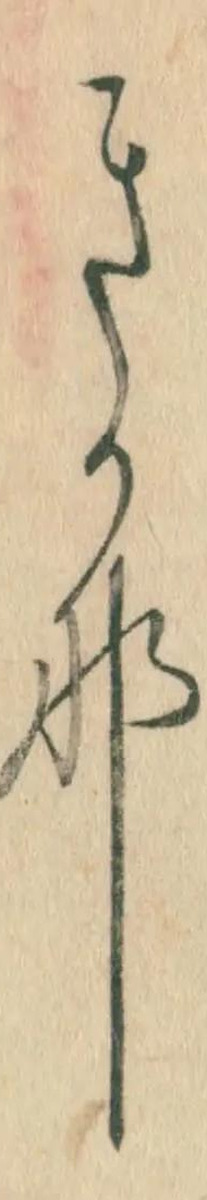きかな

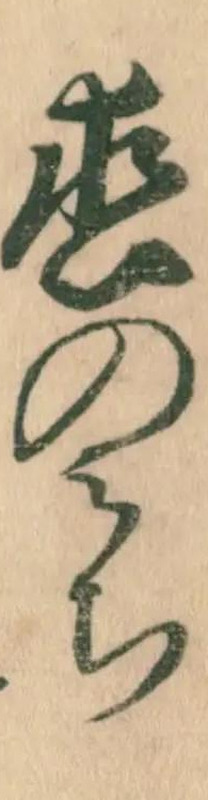恋のみち
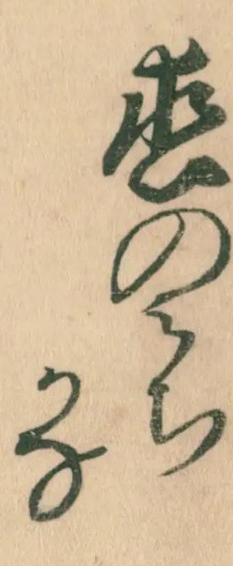恋のみち
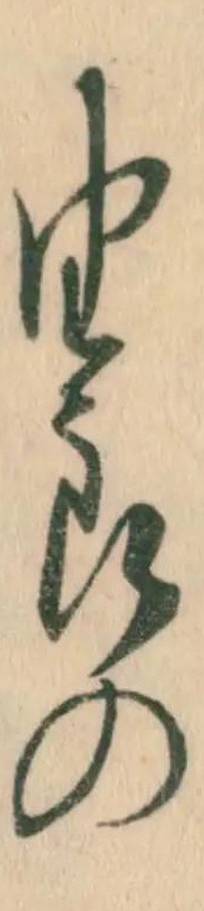由良の
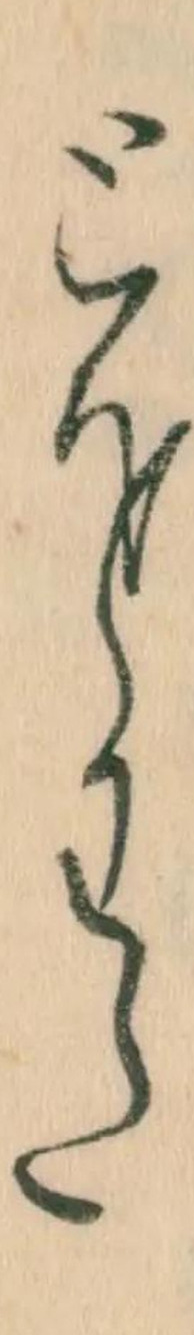とをわた
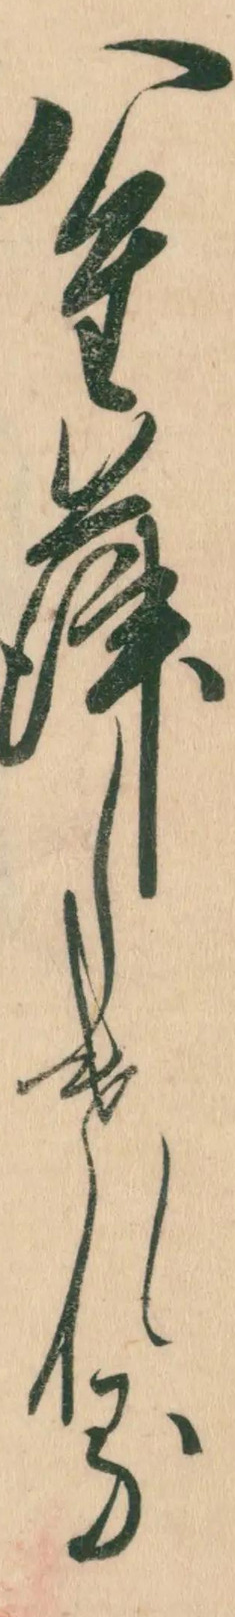八重葎しけれる
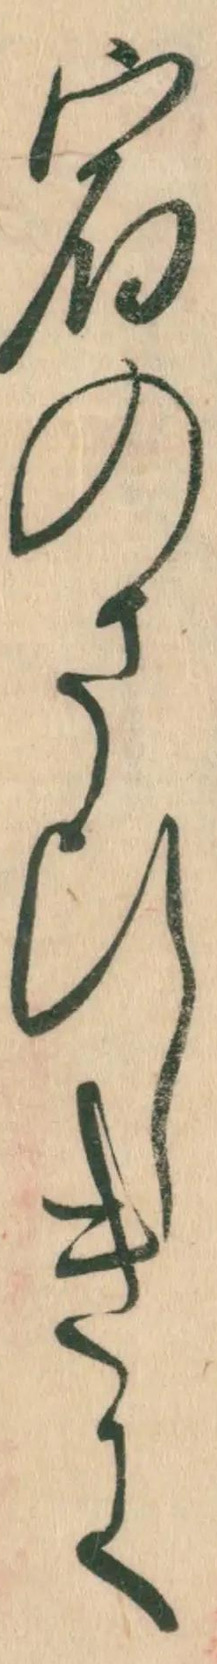宿のさひしきに
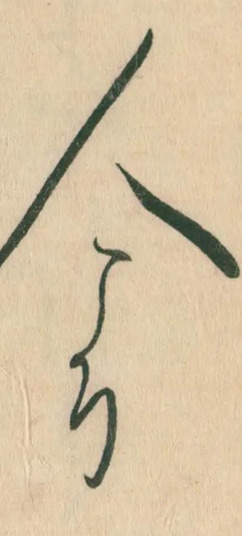人こそ
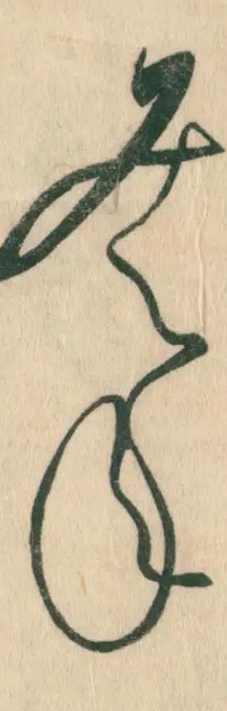みえね
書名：錦百人一首あつま織
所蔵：国立国会図書館 National Diet Library, JAPAN
